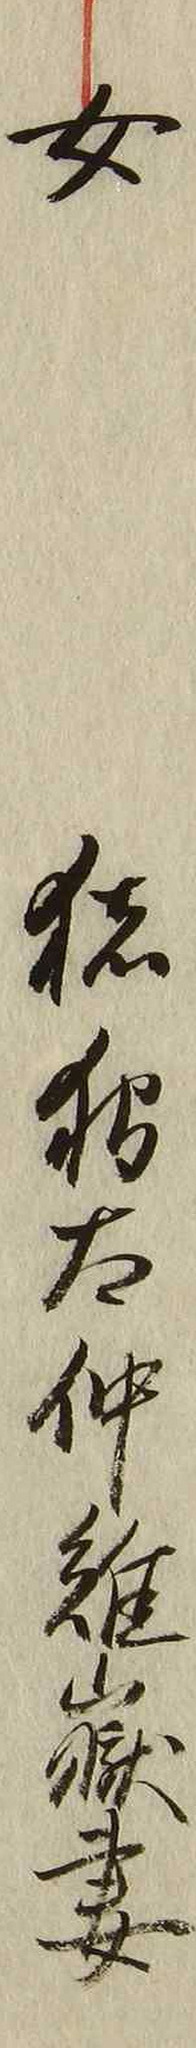女猪狩太仲雉嶽妻
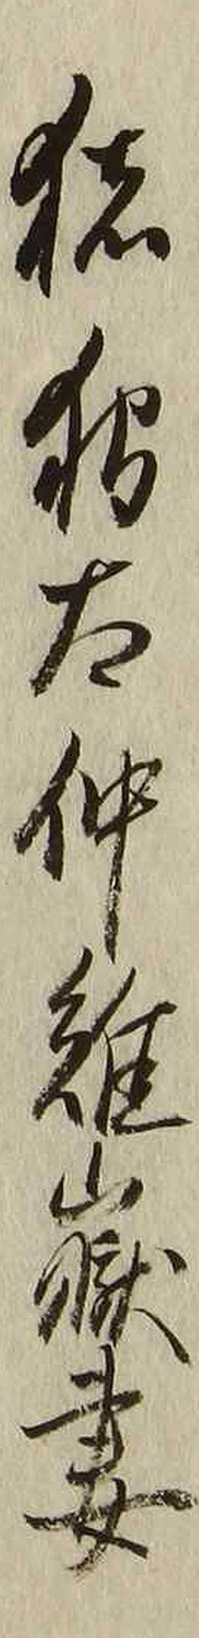女猪狩太仲雉嶽妻
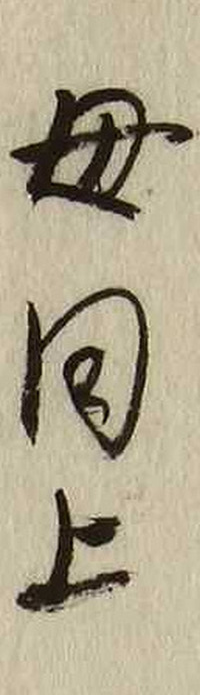母同上
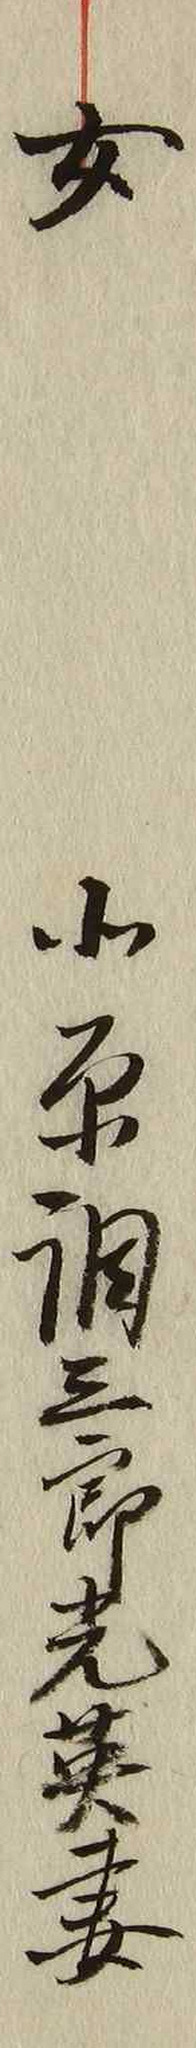女北原調三郎光英妻
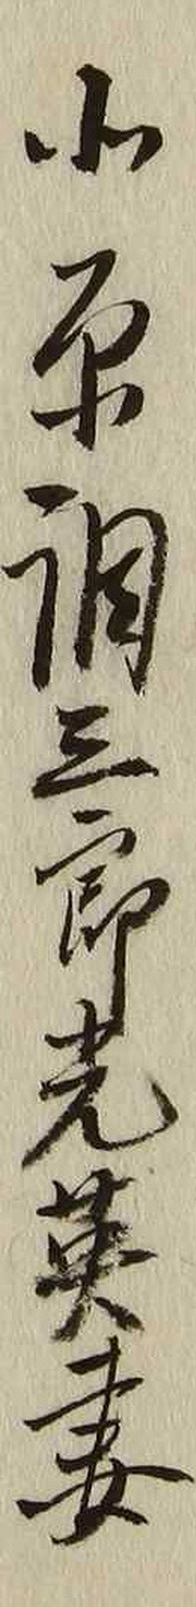女北原調三郎光英妻
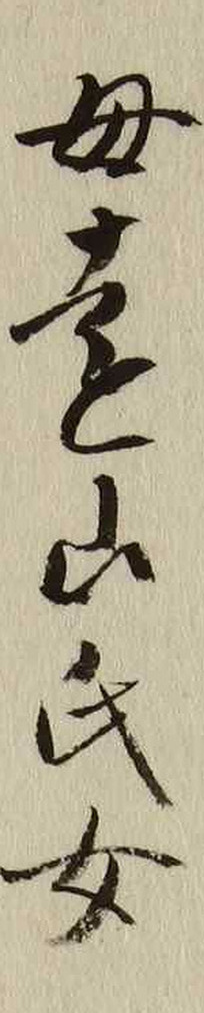母遠山氏女
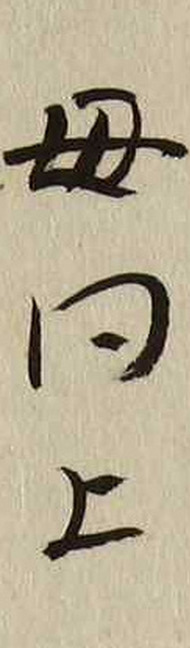母同上
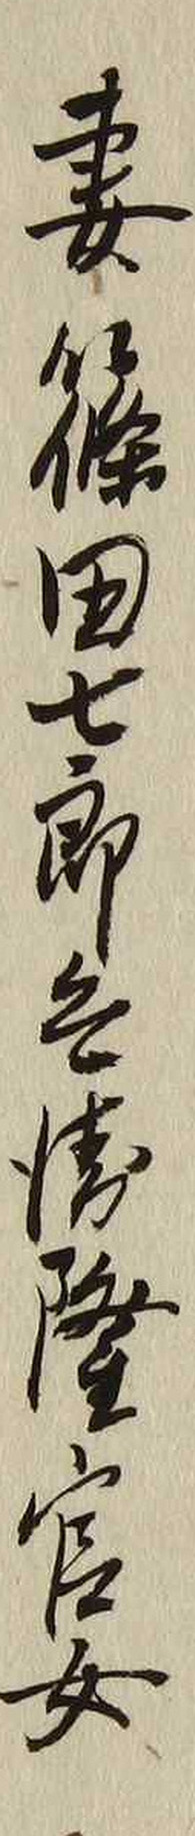妻篠田七郎兵衛隆官女
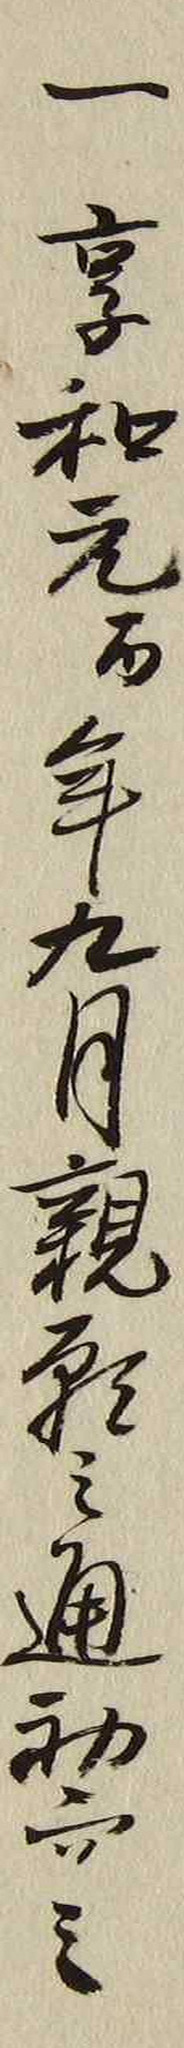一享和元酉年九月親願之通初而之
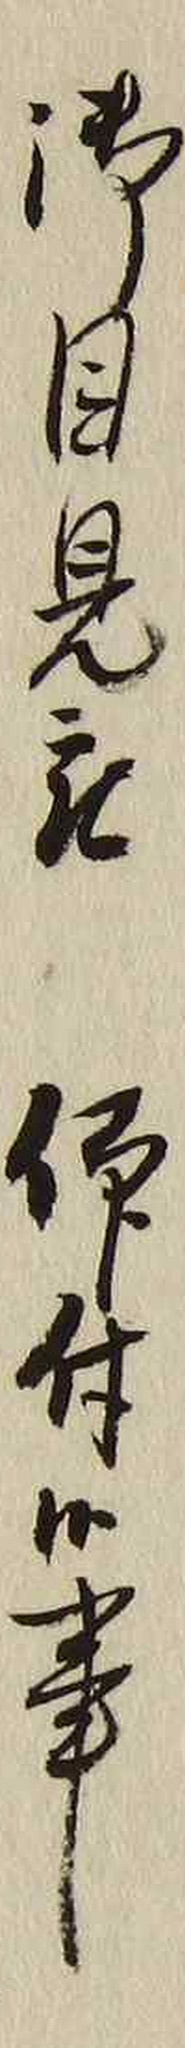御目見被仰付候事
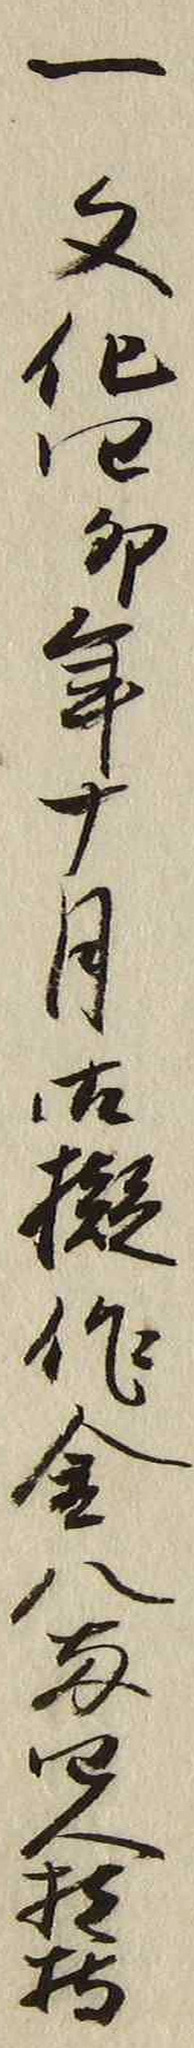一文化四卯年十月御擬作金八両四人扶持
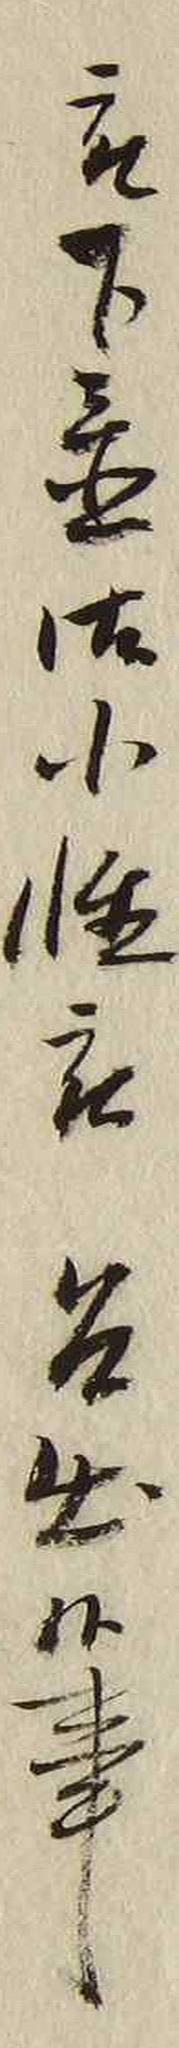被下置御小性被召出候事

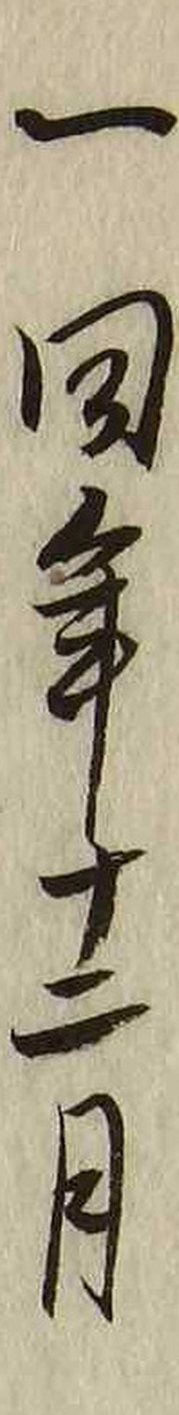一同年十二月
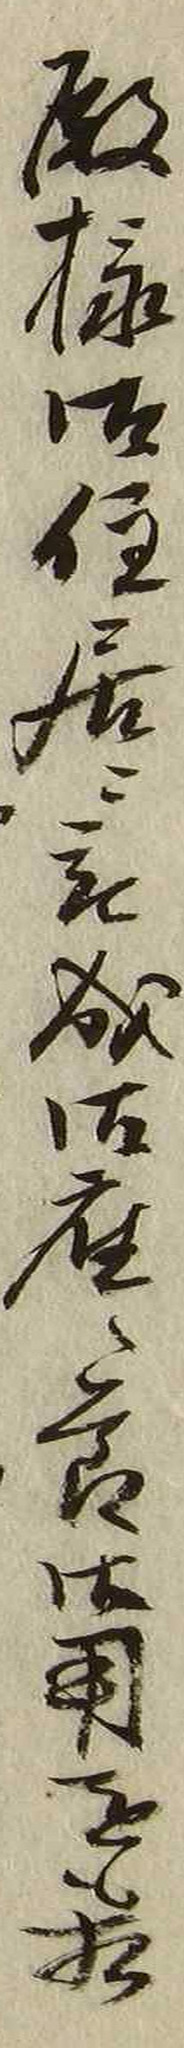殿様御住居ニ被成御座候節御用をも相
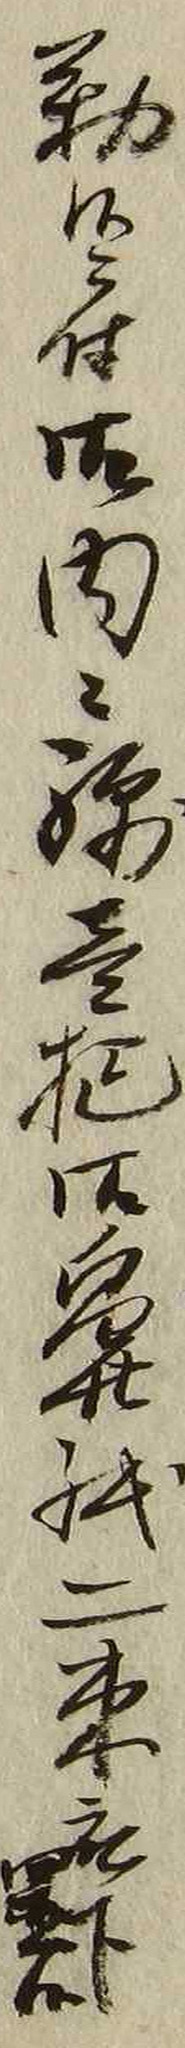勤候ニ付御内々綿壱把御鼻紙二束被下置候
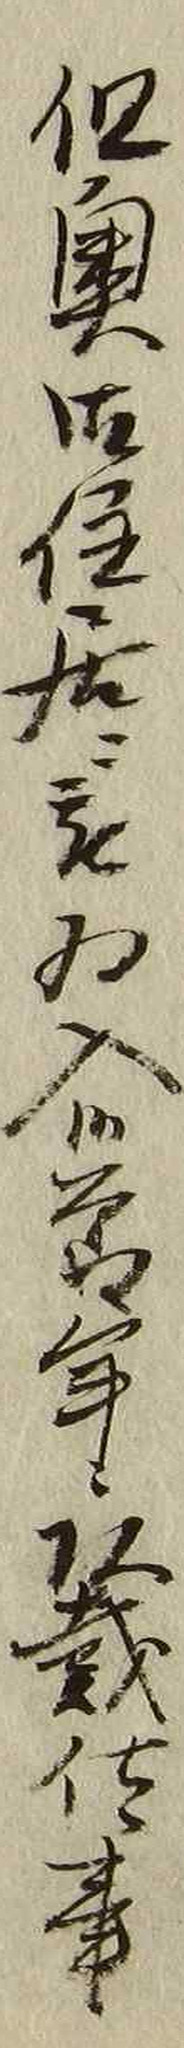但奥御住居ニ被為入候節年ニ頂戴仕候事
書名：諸士系譜　巻之356　す之部6
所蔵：会津若松市立会津図書館
